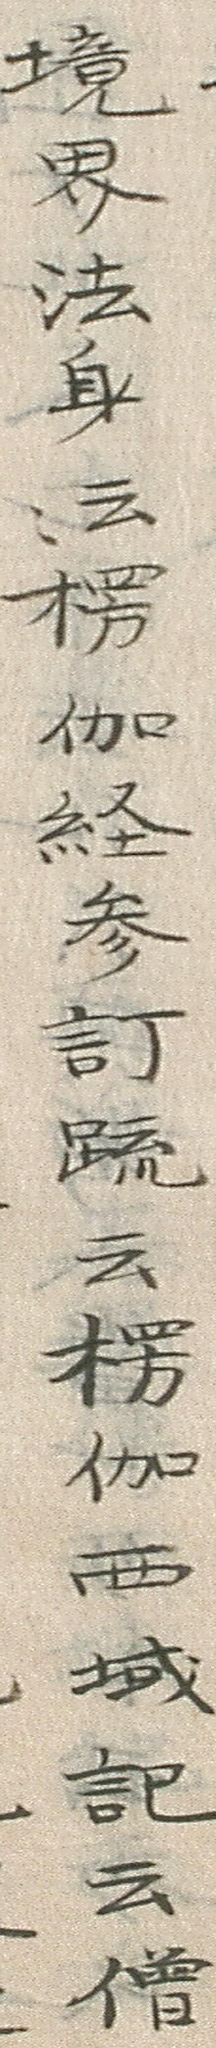境界法身云〻楞伽経参訂疏云楞伽西域記云僧
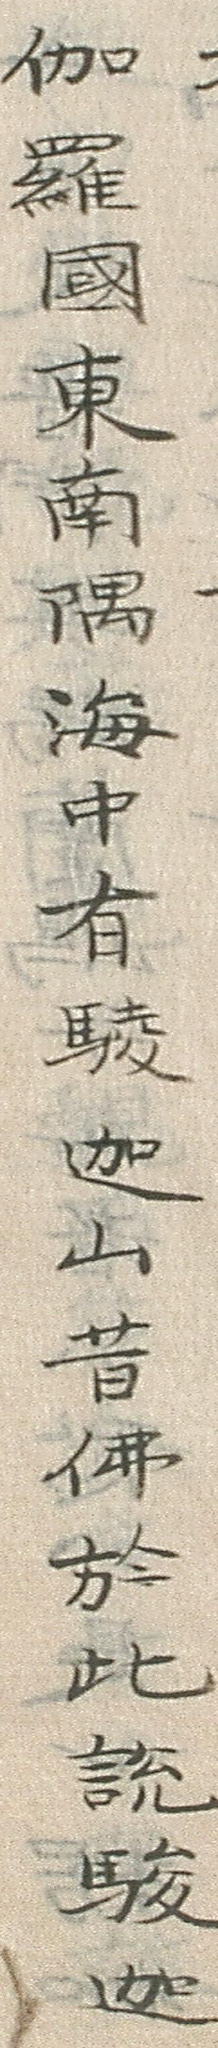伽羅国東南隅海中有駿迦山昔仏於此説駿迦
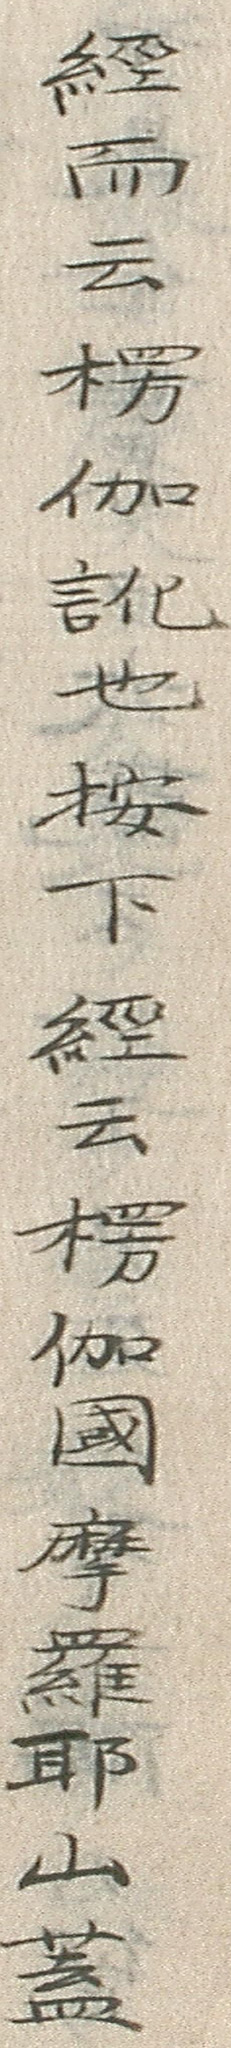経而云楞伽訛也按下経云楞伽国摩羅耶山蓋
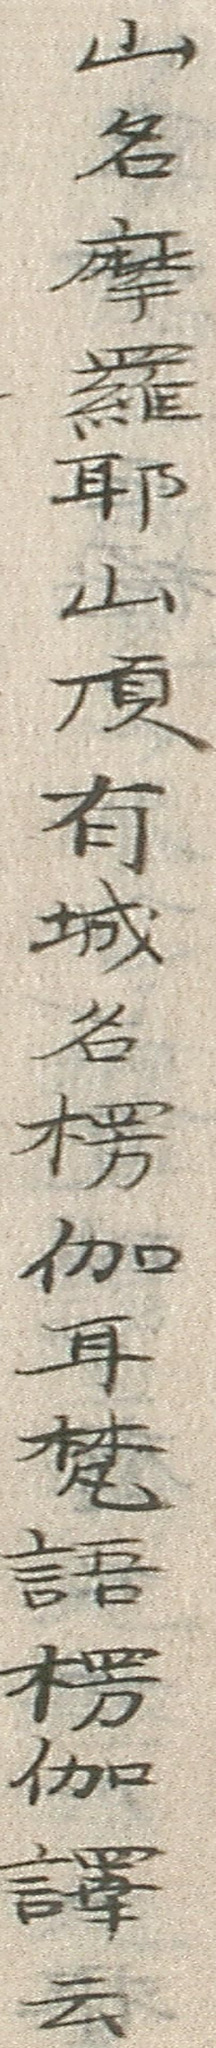山名摩羅耶山頂有城名楞伽耳梵語楞伽訳云
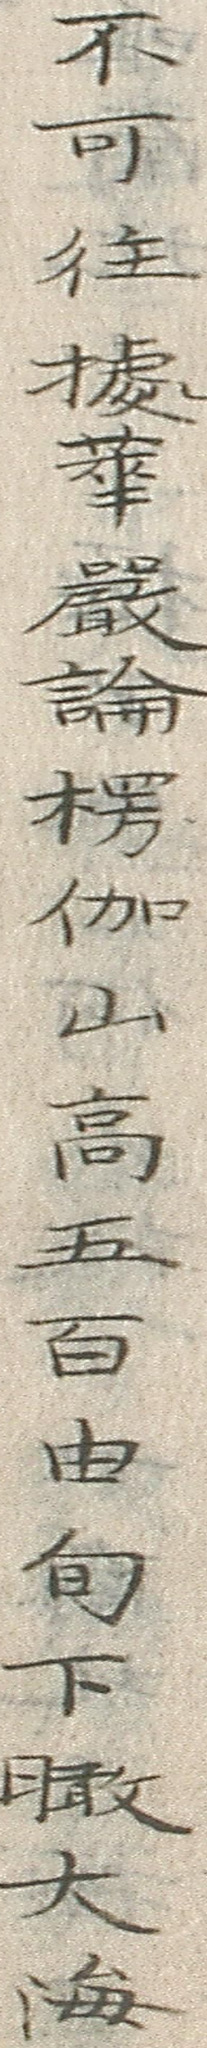不可往拠華厳論楞伽山高五百由旬下瞰大海
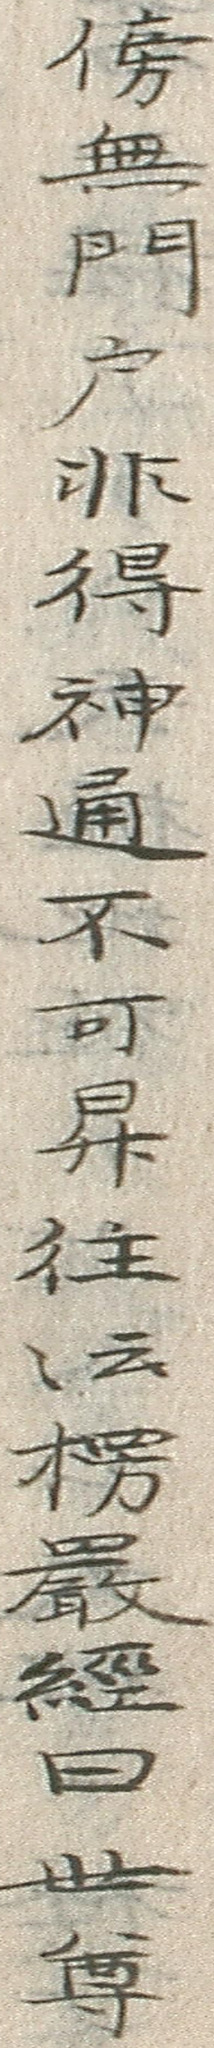傍無門戸非得神通不可昇住云〻楞巌経曰世尊
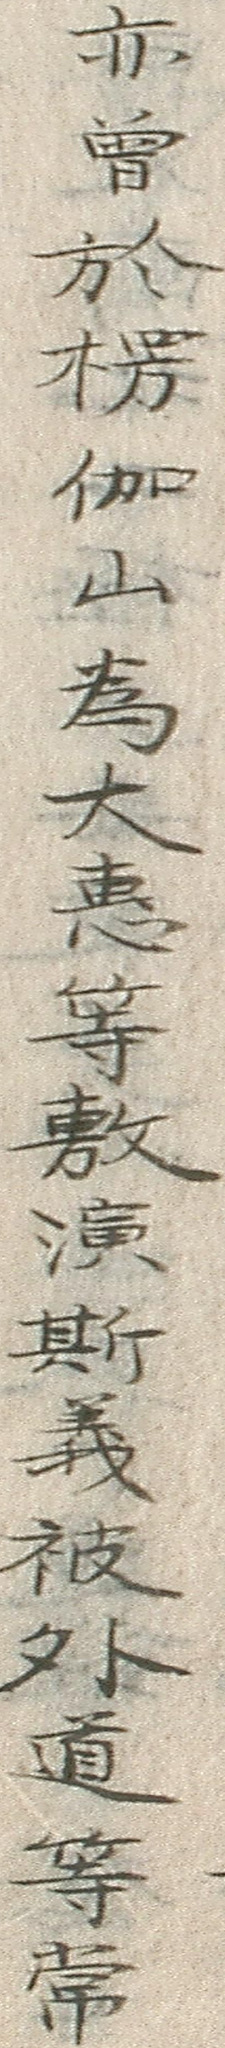亦曽於楞伽山為大恵等敷演斯義被外道等常
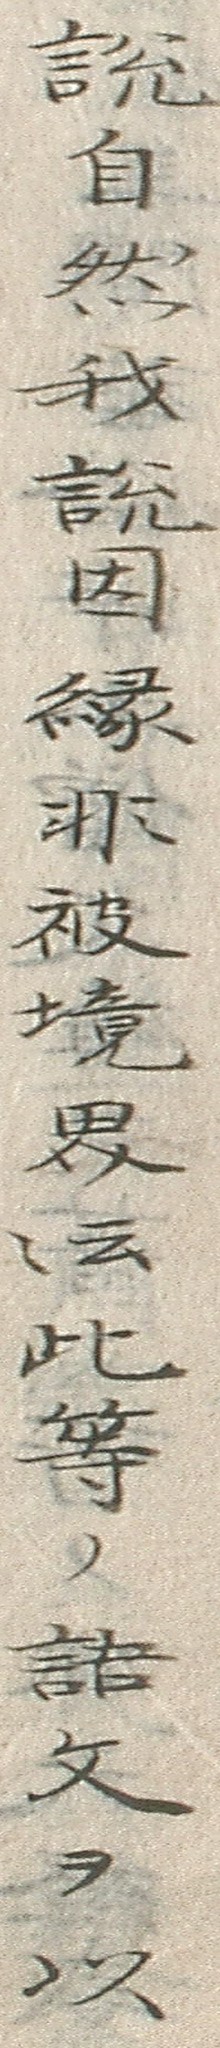説自然我説因縁非被境界云〻此等ノ諸文ヲ以
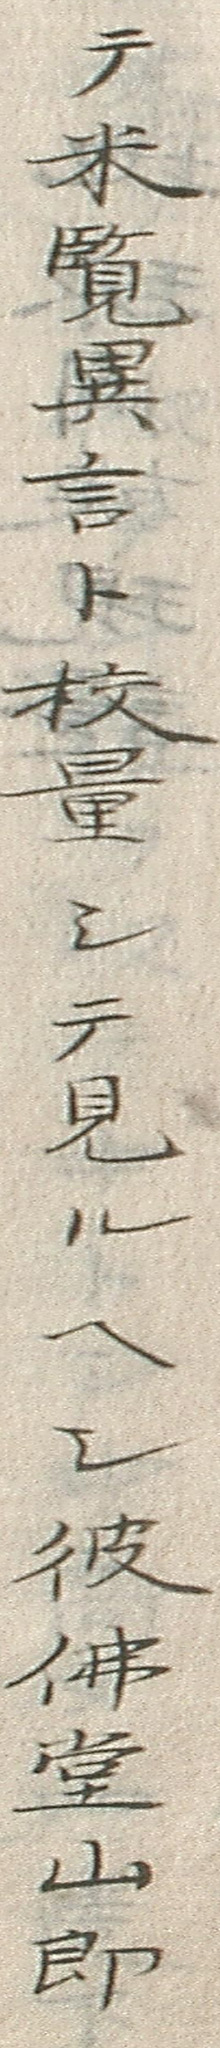テ采覧異言ト校量シテ見ルヘシ彼仏堂山即
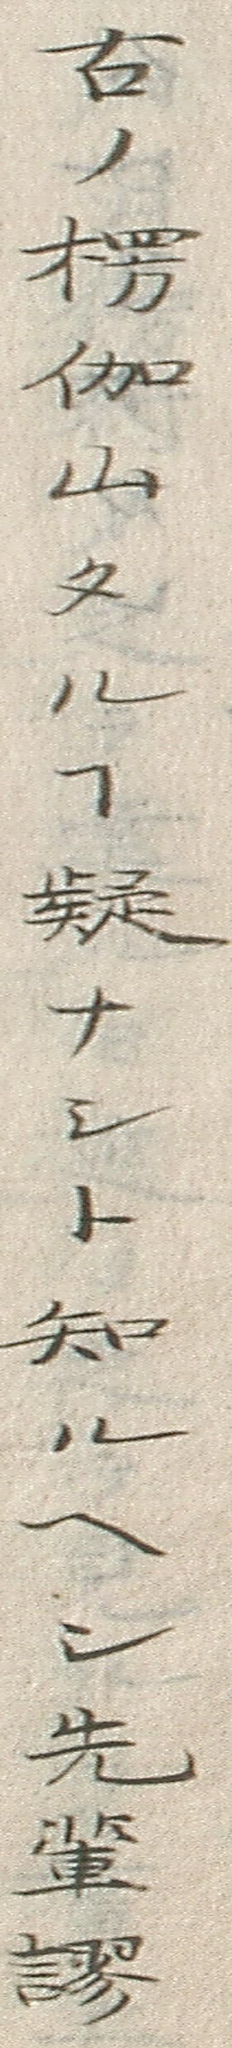古ノ楞伽山タリコト疑ナシト知ルヘシ先輩謬
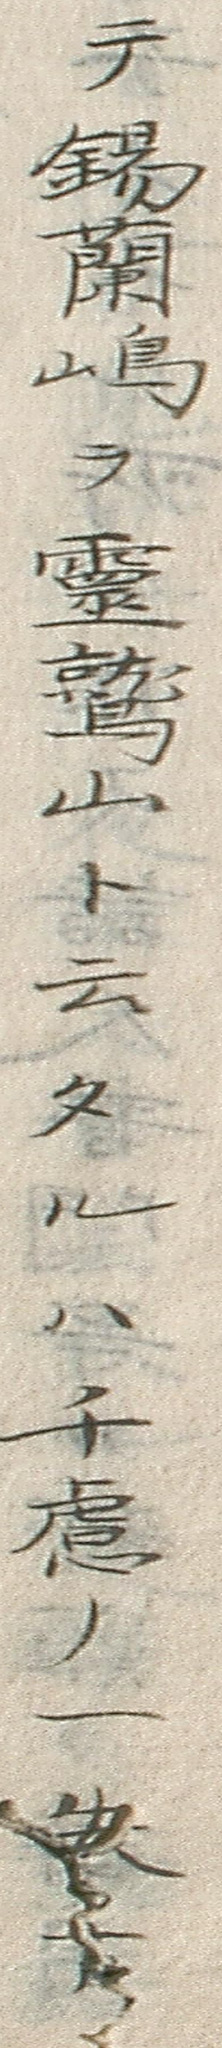テ錫蘭嶋ヲ霊鷲山ト云タルハ千慮ノ一失ナ
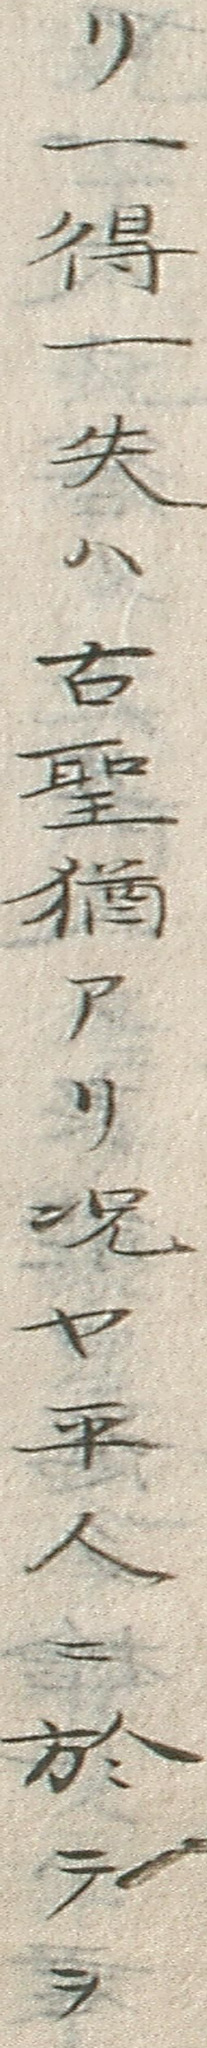リ一得一失ハ古聖猶アリ況ヤ平人ニ於テヲ

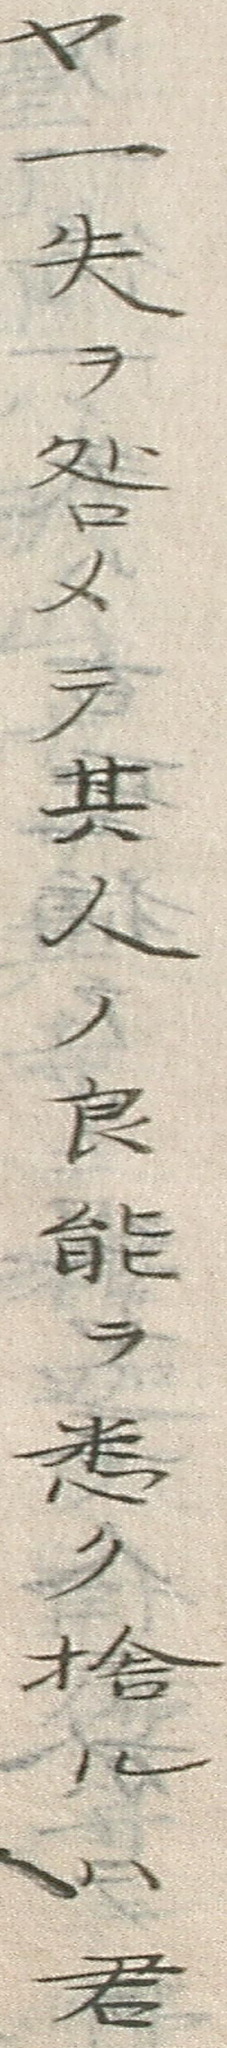ヤ一失ヲ咎メテ其人ノ良能ヲ悉ク捨ルハ君
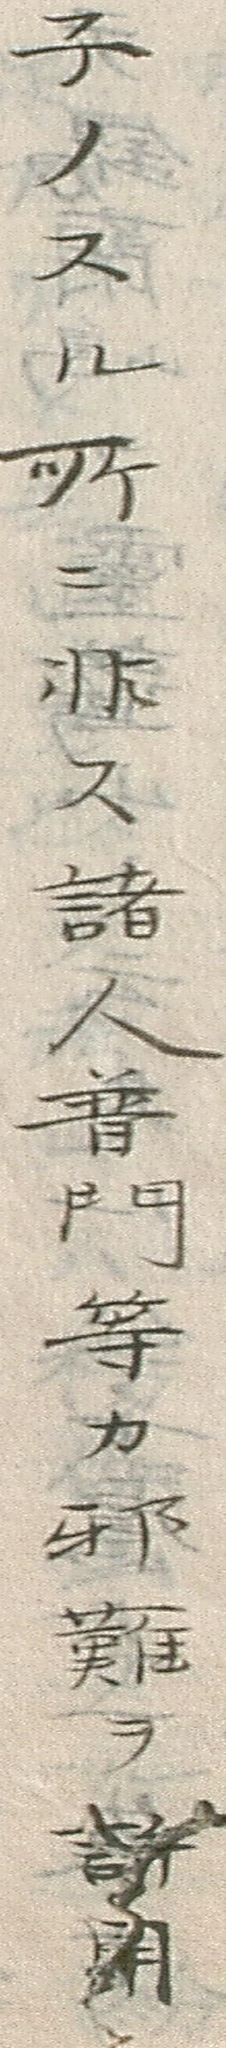子ノスル所ニ非ス諸人普門等カ邪難ヲ許用
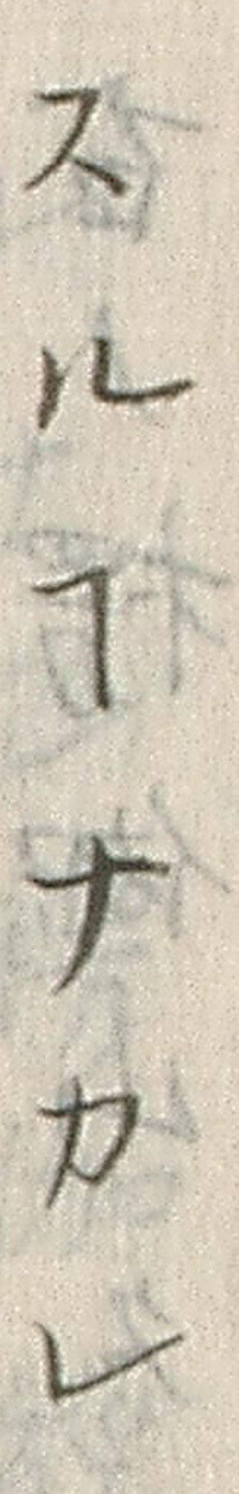スルコトナカレ
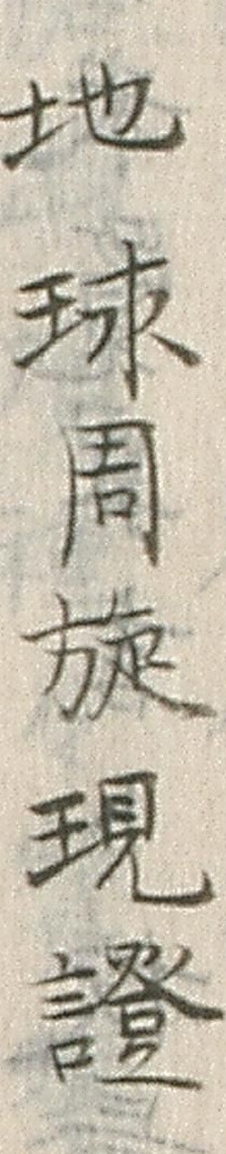地球周旋現証
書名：天學略名目羽翼　全
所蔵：東京大学地震研究所図書室 Earthquake Research Institute Library, The University of Tokyo, JAPAN
